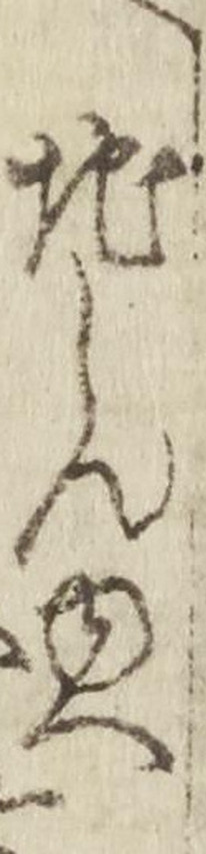地しんゆへ
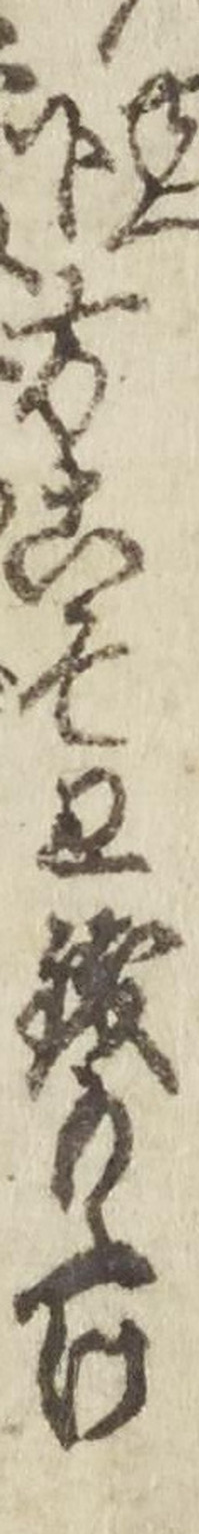下方こそわ銭もふけ
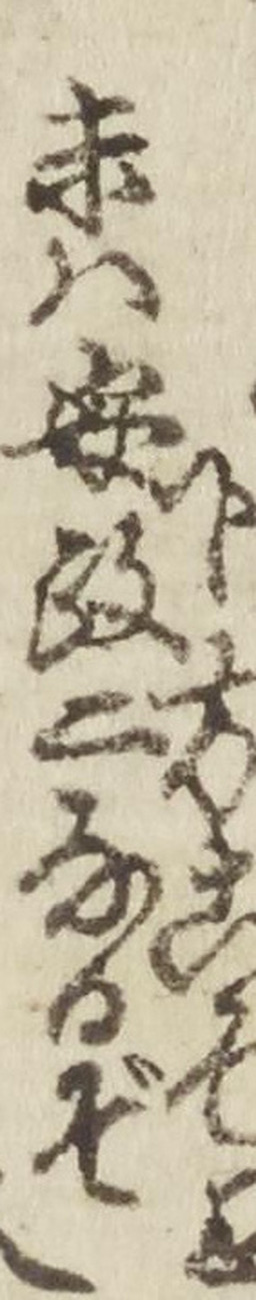未は安政二なるぞ
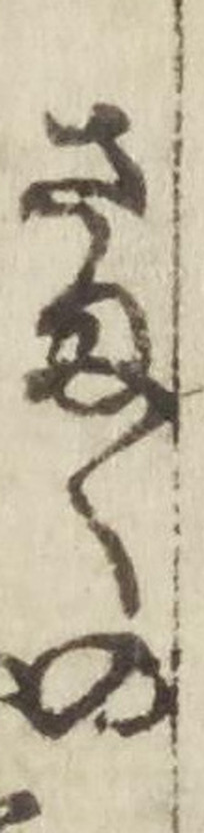さま〳〵の
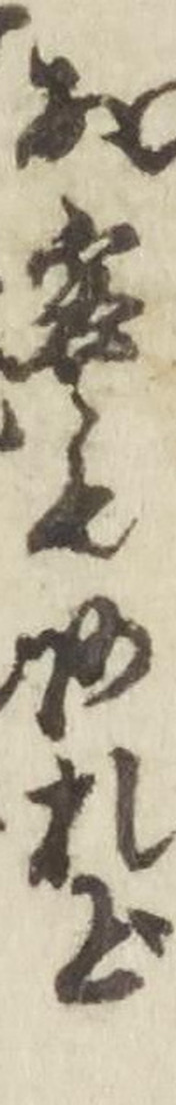お客もあれど
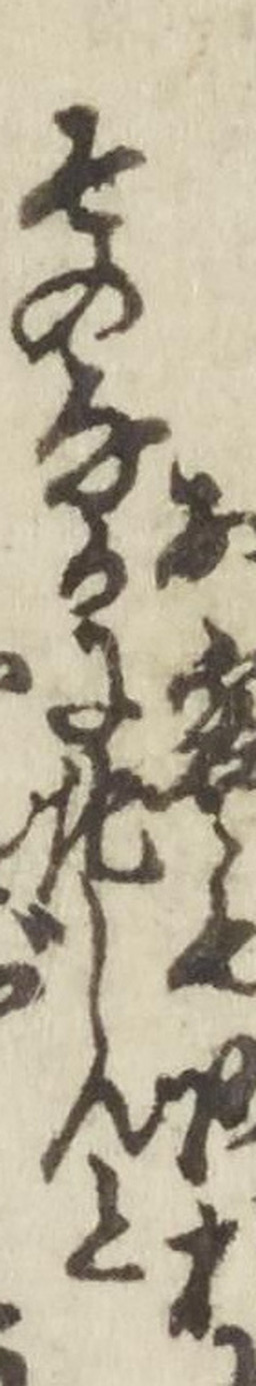そのなかに地しんと
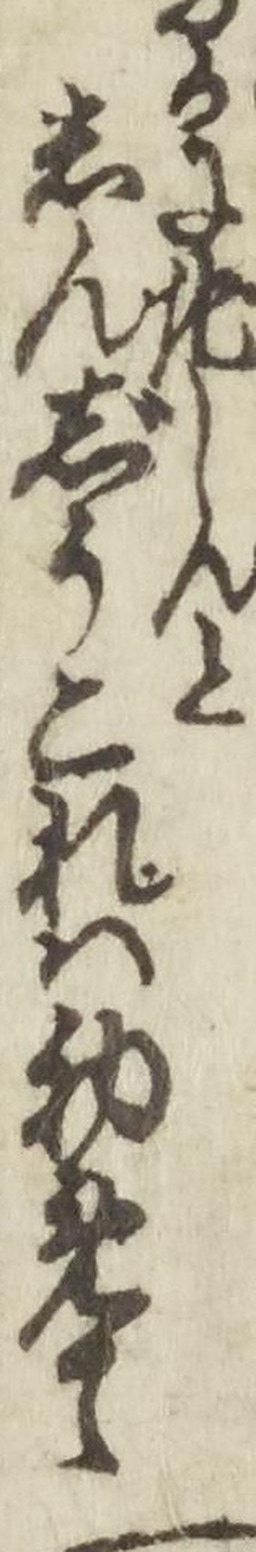しんじうこれは初めて
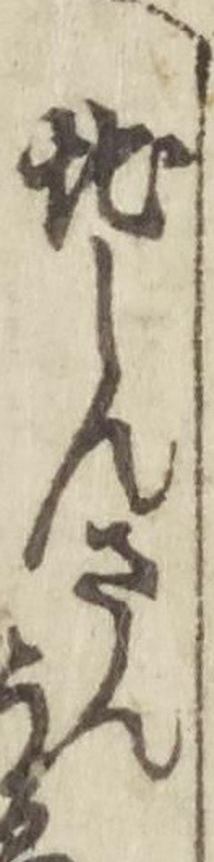地しんさん
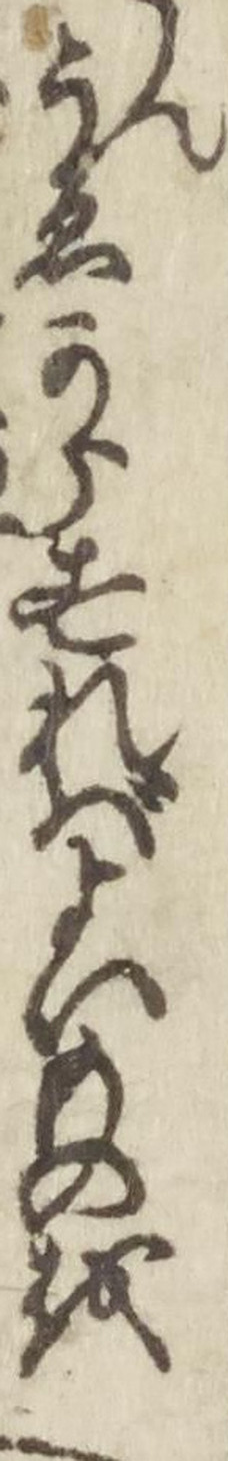うゑからすればよいものを
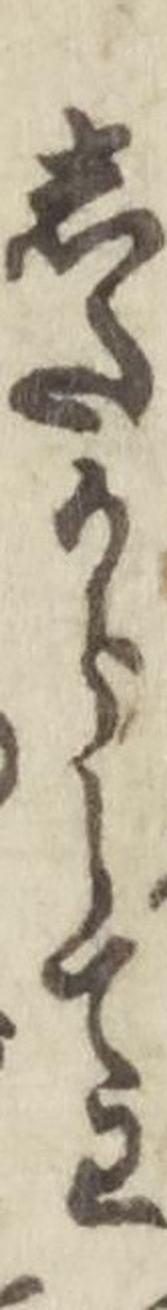したからしてわ
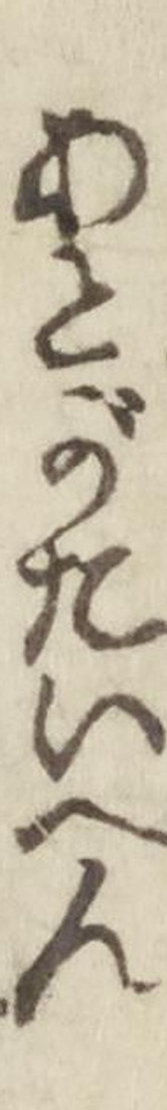あとがたいへん
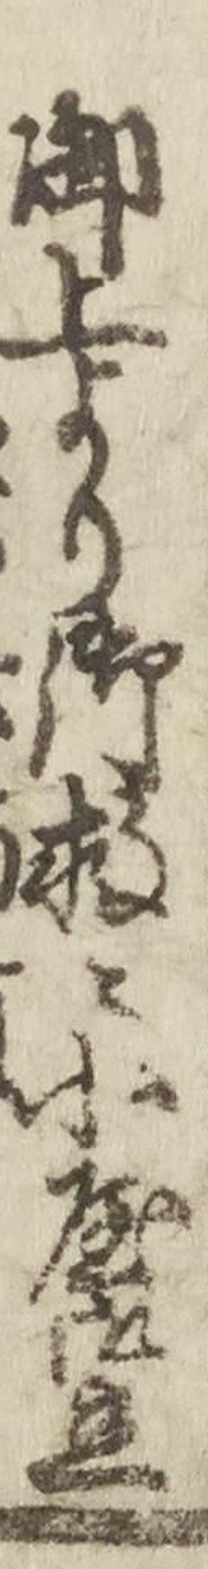御上より御救ニ小屋御立
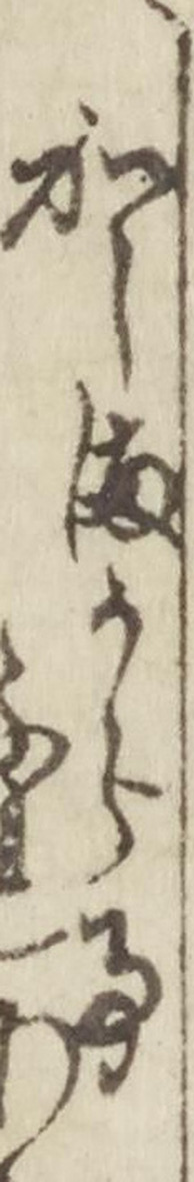かしまから事
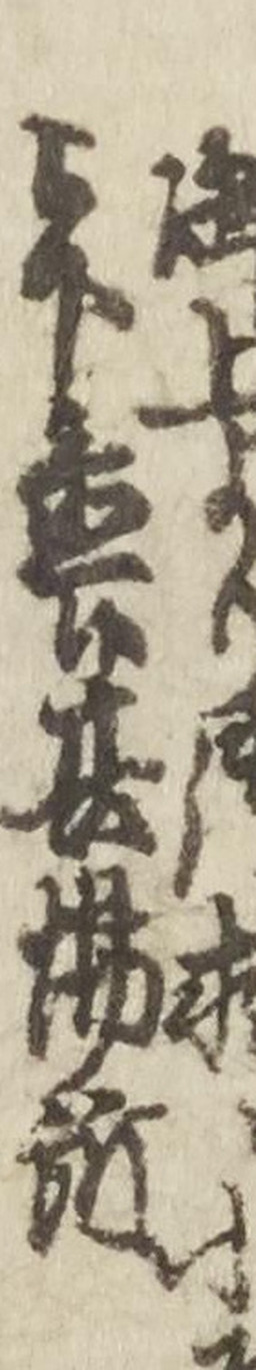被下置候其場所
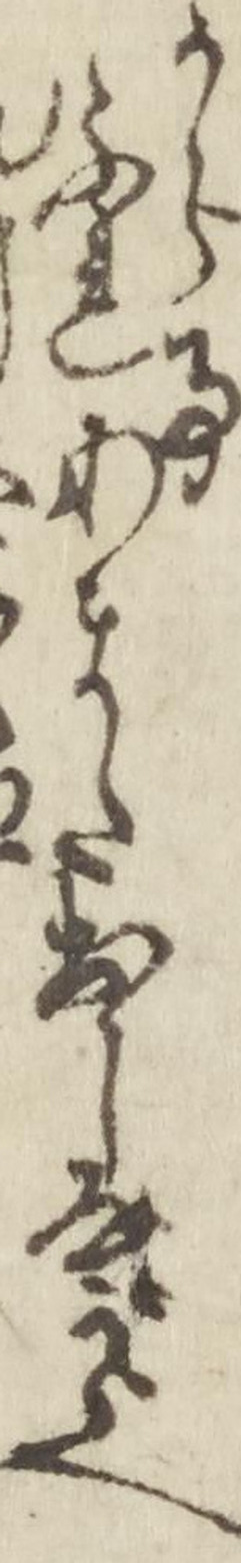ふれあまた出しなから
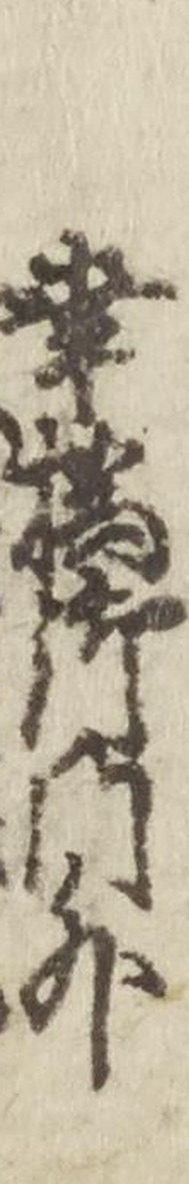幸橋御門外
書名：しんぱん三十六哥仙
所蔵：東京大学地震研究所図書室 Earthquake Research Institute Library, The University of Tokyo, JAPAN
